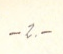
-2.-
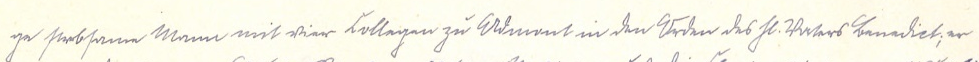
ge strebsame Mann mit vier Collegen zu Admont in den Orden des hl. Vaters Benedict; er
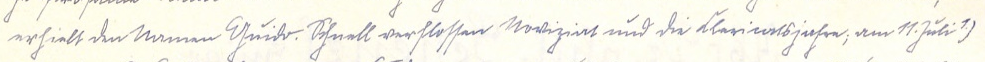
erhielt den Namen Guido. Schnell verflossen Noviziat und die Clericatsjahre; am 11. Juli1.)
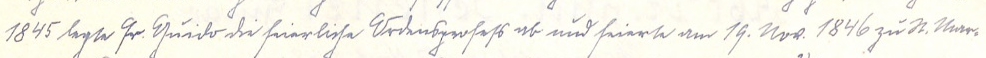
1845 legte Fr. Guido die feierliche Ordensprofess ab und feierte am 14. Nov. 1846 zu St. Mar-
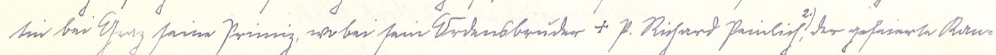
tin bei Graz seine Primiz, wobei sein Ordensburder + P. Richard Peinlich2.), der gefeierte Kan-
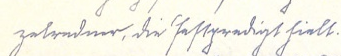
zelredner, die Festpredigt hielt.
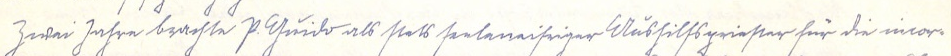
Zwei Jahre brachte P. Guido als stets seeleneifriger Aushilfspriester für die incor-
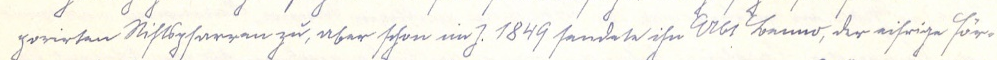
porierten Stiftspfarren zu, aber schon im J. 1849 sendete ihn Abt Benno, der eifrige För-
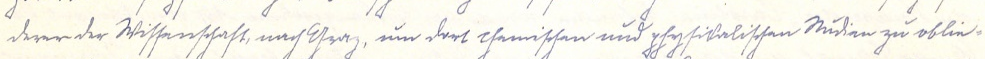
derer der Wissenschaft, nach Graz, um dort chemische und physikalische Studien zu oblie-
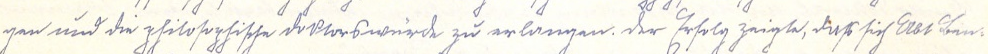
gen und die philosophische Doctorswürde zu erlangen. Der Erfolg zeigte, dass sich Abt Ben-
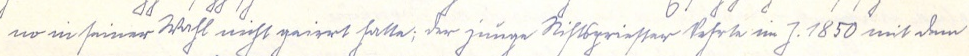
no mit seiner Wahl nicht geirrt hatte; der junge Stiftspriester kehrte im J. 1850 mit dem
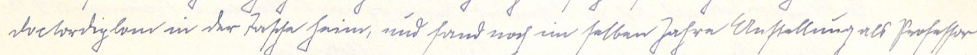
Doctordiplion in der Tasche heim, und fand noch im selben Jahre Anstellung als Professor
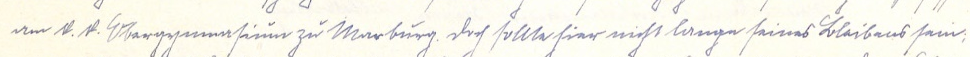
am k. k. Obergymnasium zu Marburg. Doch sollte hier nicht lange seines Bleibens sein;
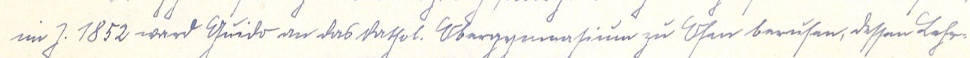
im J. 1852 ward Guido an das dathol. Obergymnasium zu Ofen berufen, dessen Lehr-
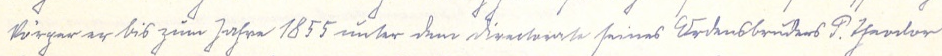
körper er bis zum Jahre 1855 unter dem Directorate seines Ordensbruders P. Theodor
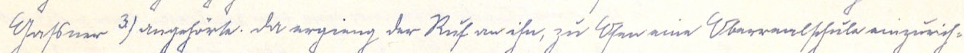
Gasser3.) angehörte. Da erging der Ruf an ihn, zu Ofen eine Oberrealschule einzurich-
